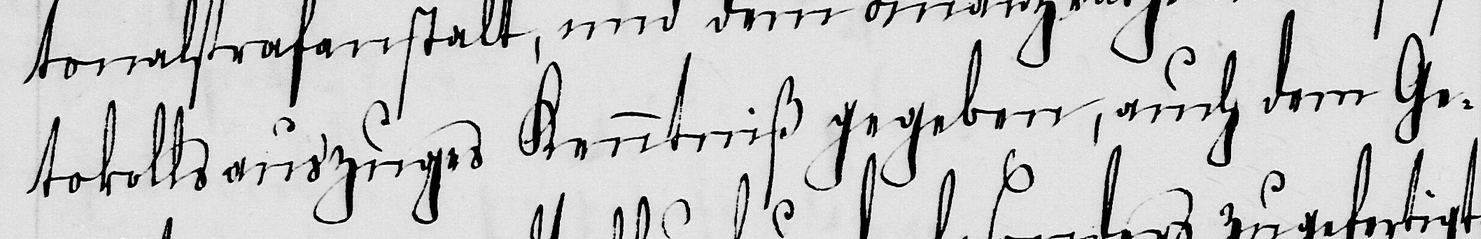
tokollsauszuges Kenntniß gegeben, auch dem Ge¬
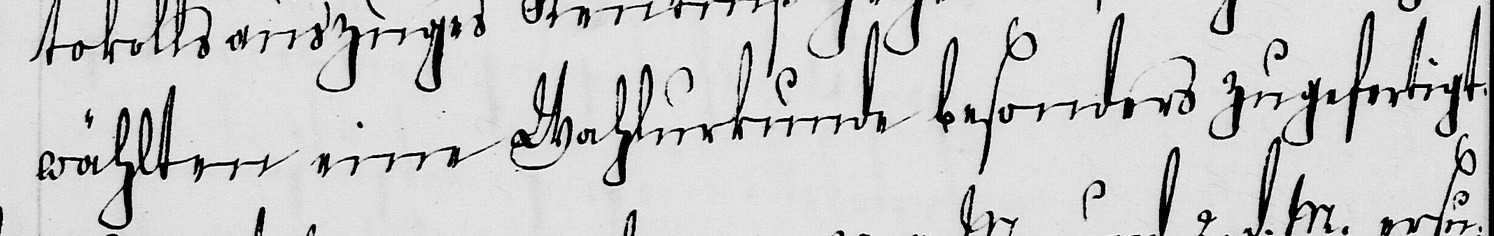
wählten eine Wahlurkunde besonders zugefertig¬
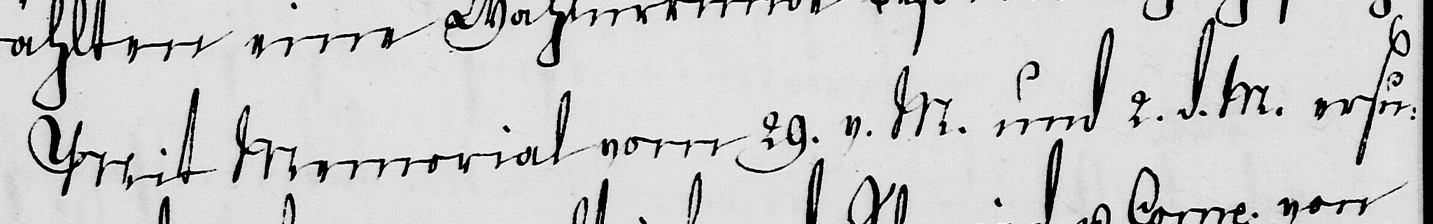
Mit Memorial vom 29. v. M. und 2. d. M. ersu¬
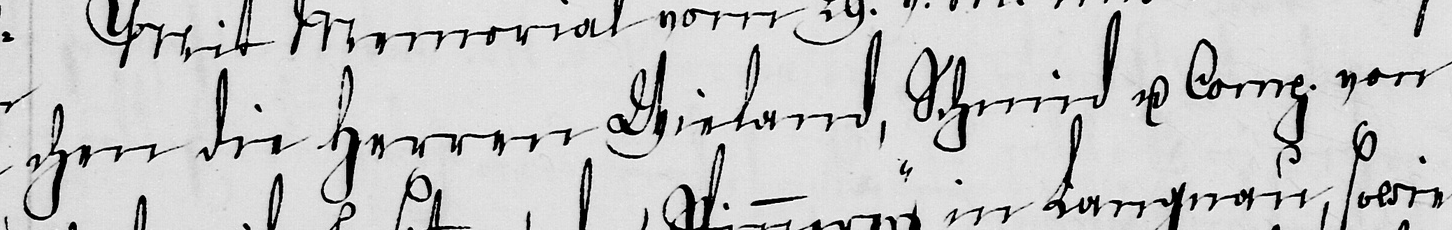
chen die Herren Wieland, Schmid u. Comp. von
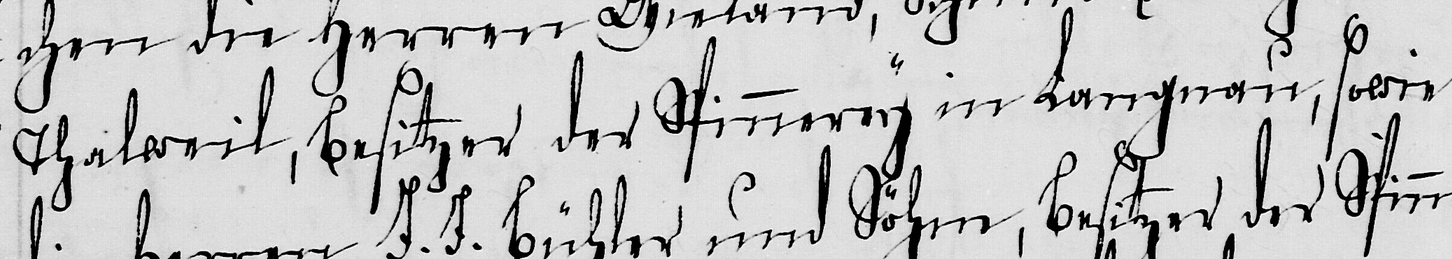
Thalweil, Besitzer der Spinnerey in Langnau, sowie
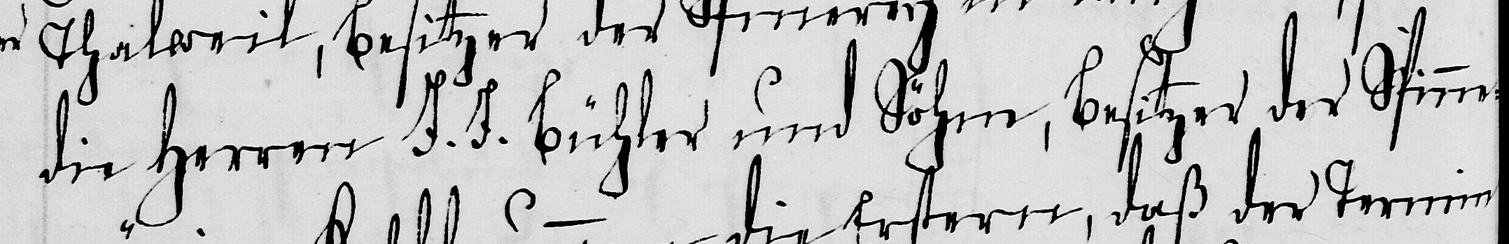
die Herren J. J. Bühler und Söhne, Besitzer der Spin¬
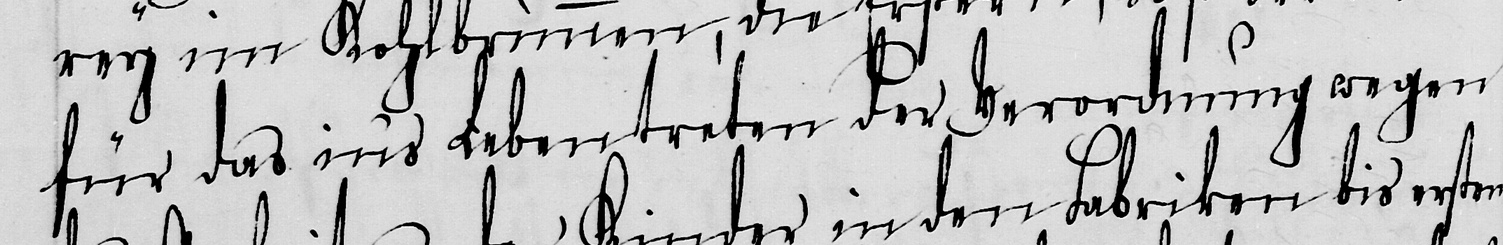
für das ins Leben treten der Verordnung wegen
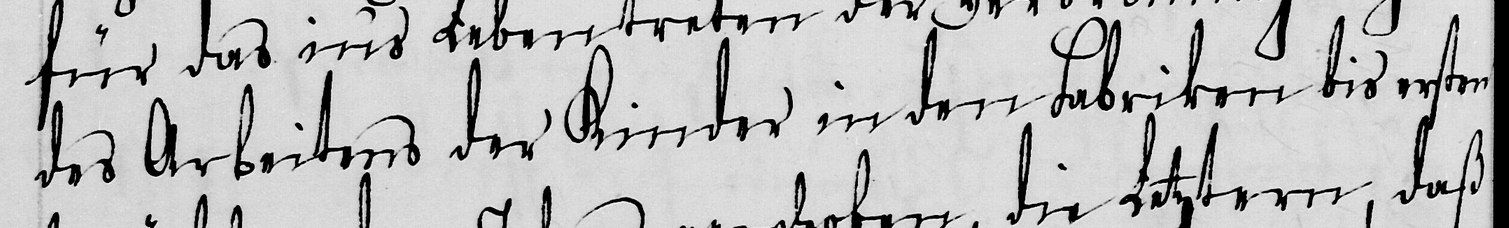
des Arbeitens der Kinder in den Fabriken bis ers¬
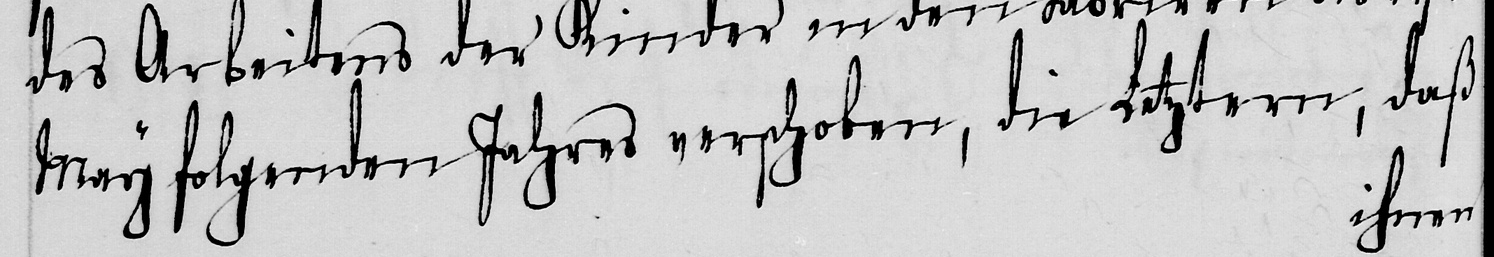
May folgenden Jahres verschoben, die Letztern, daß
